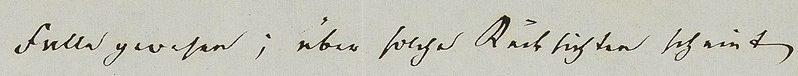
Falle gewesen; über solche Rücksichten scheint
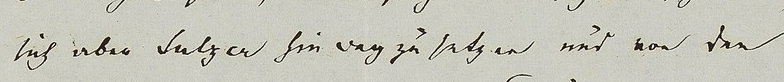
sich aber Sulzer hinwegzusetzen und von den
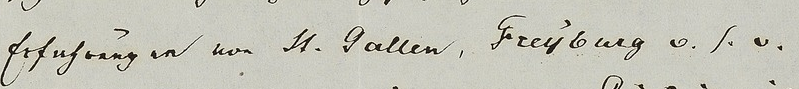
Erfahrungen von St. Gallen, Freyburg u. s. w.
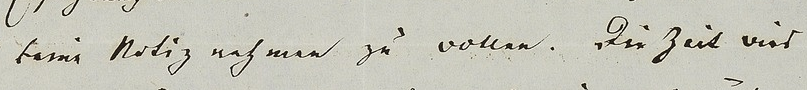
keine Notiz nehmen zu wollen. Die Zeit wird
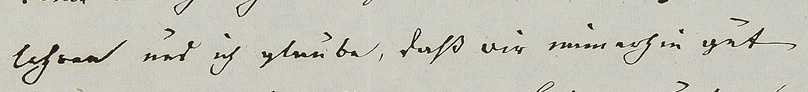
lehren und ich glaube, daß wir immerhin gut
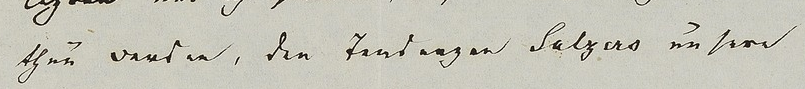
thun werden, den Tendenzen Sulzers unsere
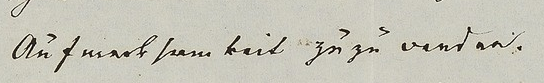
Aufmerksamkeit zuzuwenden.
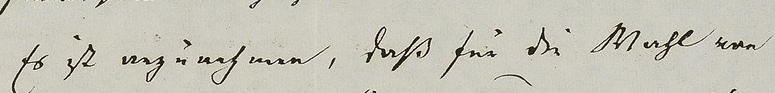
Es ist anzunehmen, daß für die Wahl von
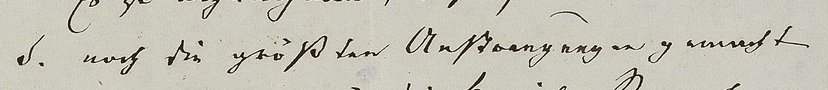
S. noch die größten Anstrengungen gemacht
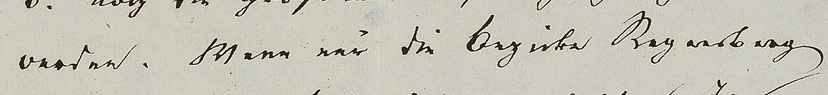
werden. Wenn nur die Bezirke Regensberg
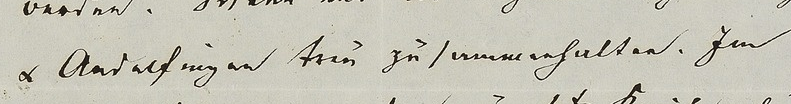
& Andelfingen treu zusammenhalten. Im
